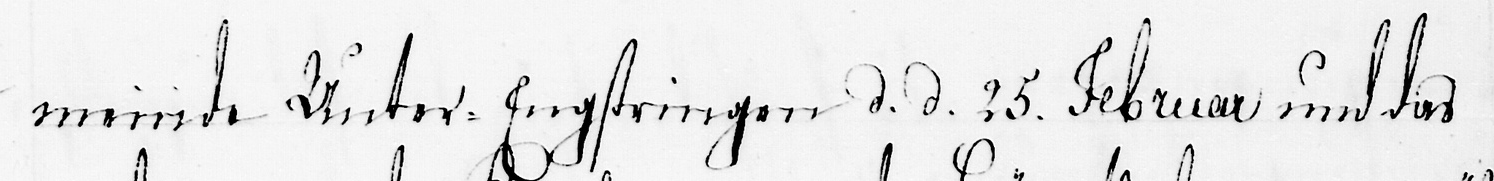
meinde Unter-Engstringen d. d. 25. Februar und das
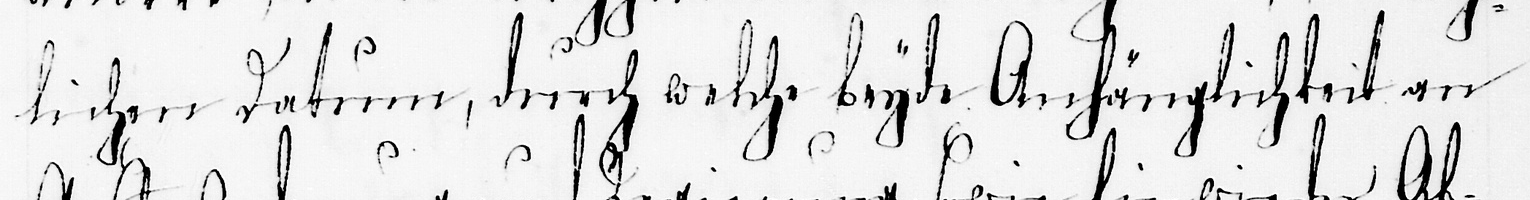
lichen Datum, durch welche beyde Anhänglichkeit an
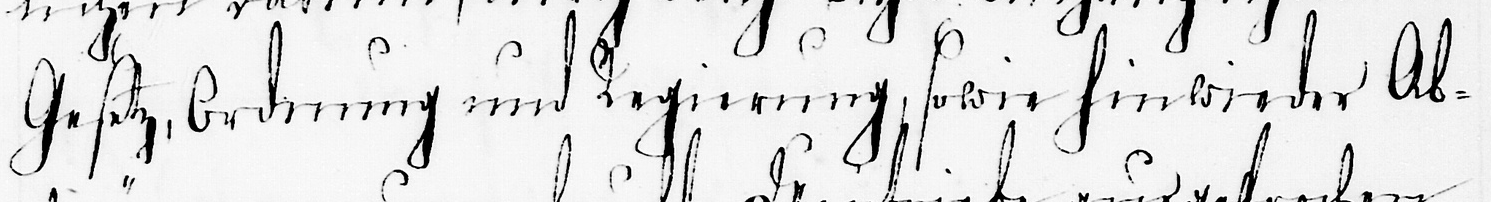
Gesetz, Ordnung und Regierung, sowie hinwieder Ab¬
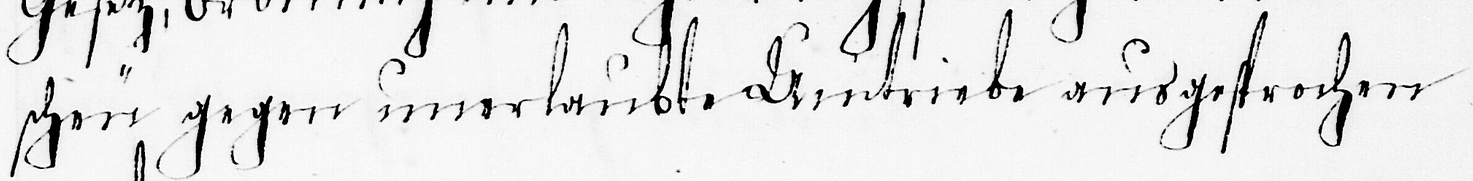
scheu gegen unerlaubte Umtriebe ausgesprochen
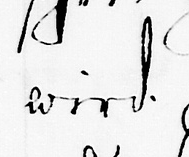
wird.
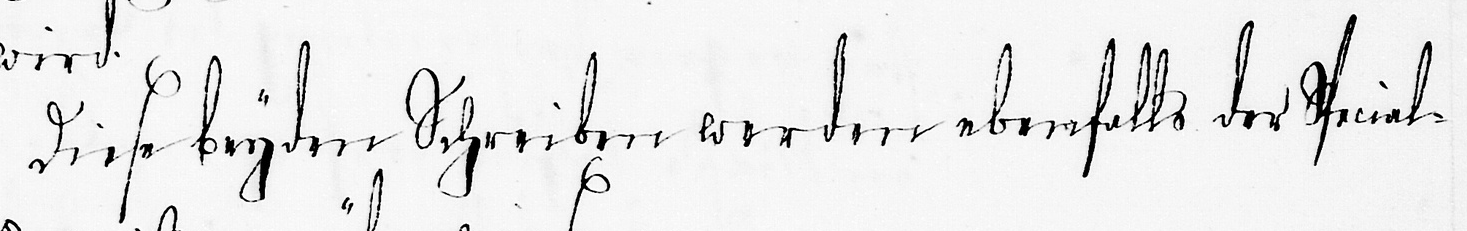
Diese beyden Schreiben werden ebenfalls der Spec¬
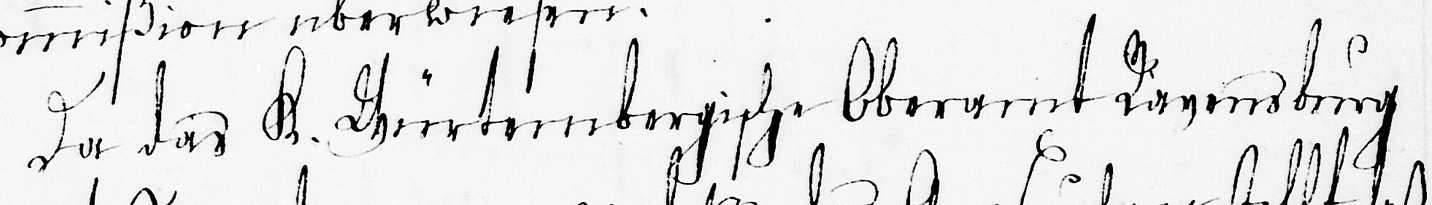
Da das K. Würtembergische Oberamt Ravensburg
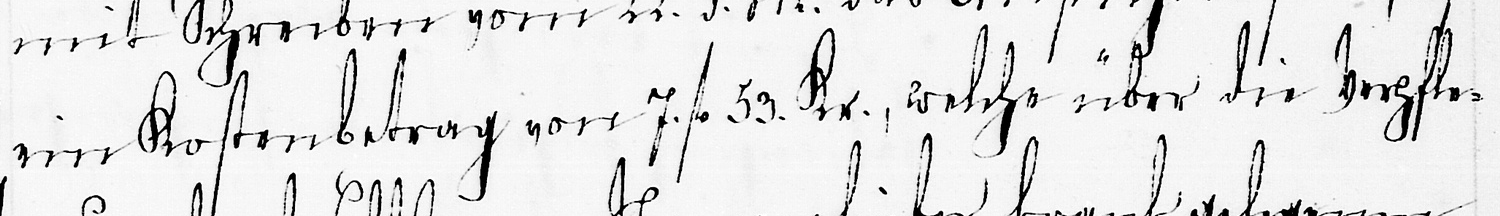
ein Kostenbetrag von 7. fl. 53. Kr., welche über die Verpfle¬
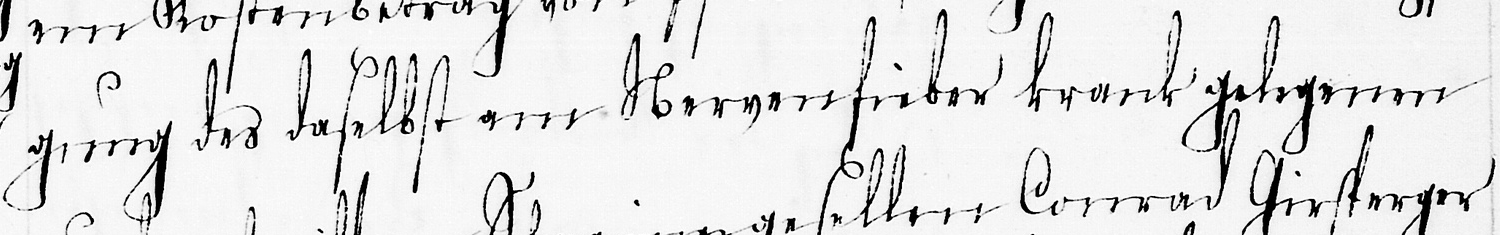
gung des daselbst am Nervenfieber krank gelegenen
